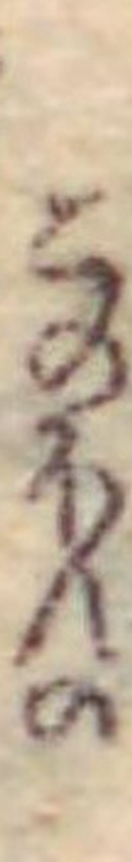このほんの
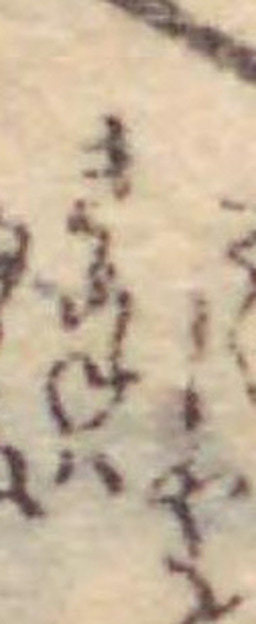きめねは
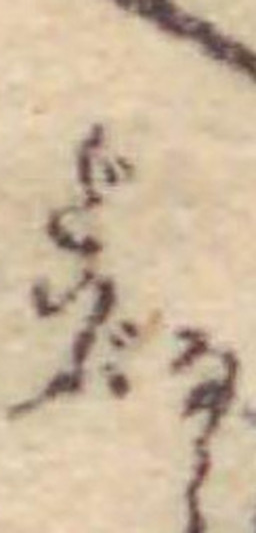だいぶ
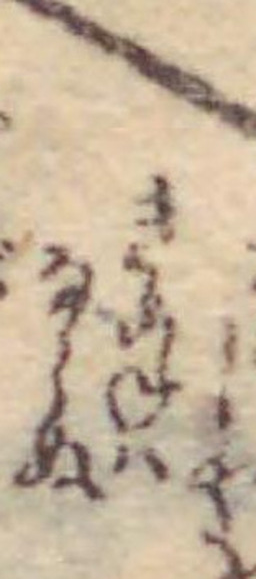ならぬ
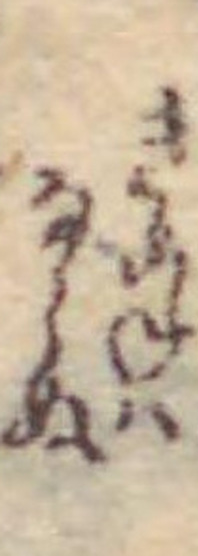ならぬ

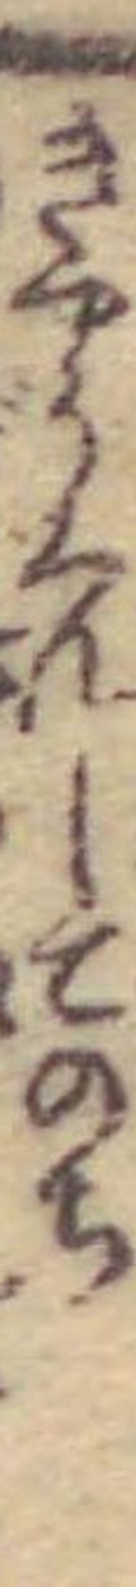きやうくんしてのち
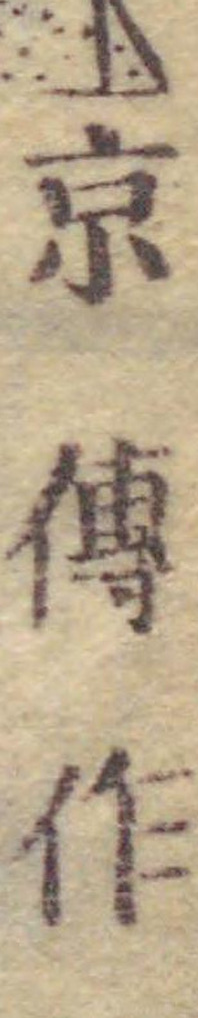京伝作
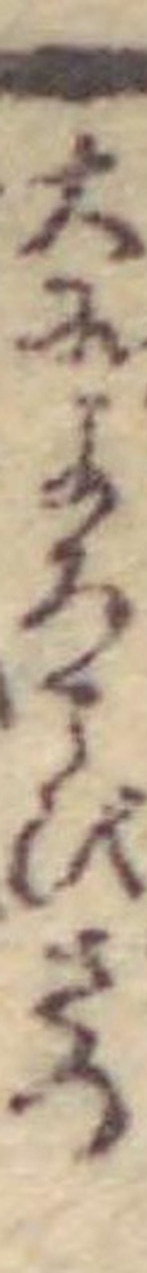大によろこびさつ
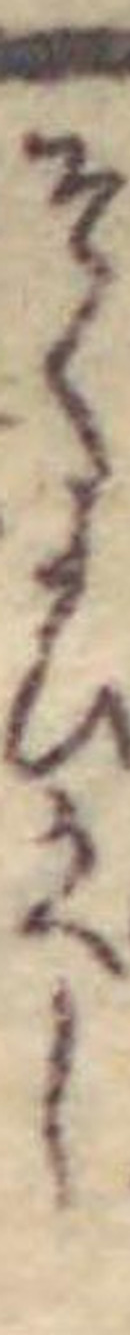そくよひかへし
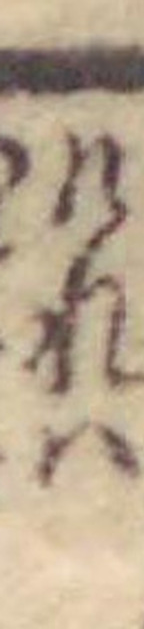けれは
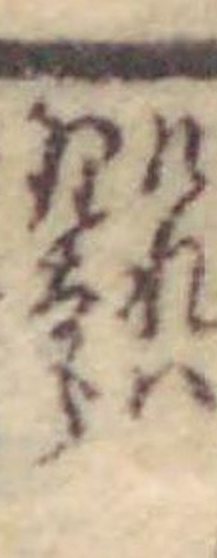理太郎
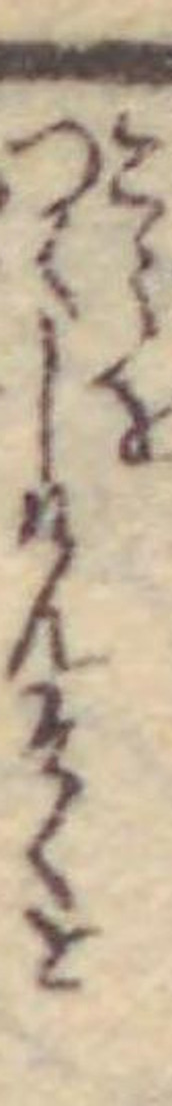つくしけんそくを
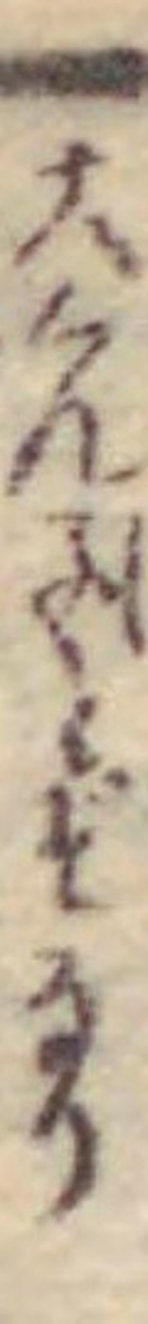大くん子とぞなり
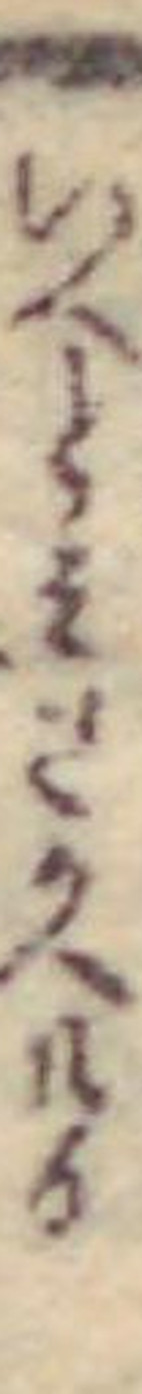いへとみさかへける
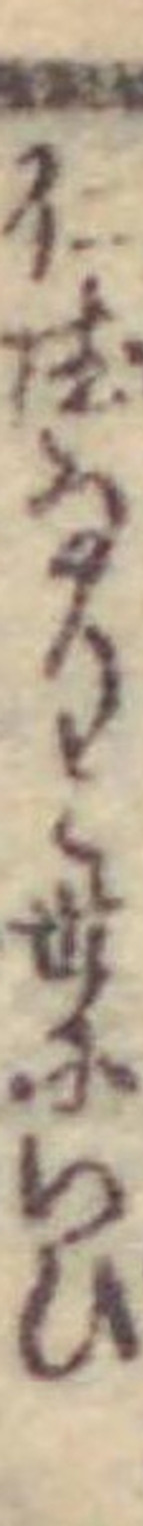仁徳なりと世にいひ
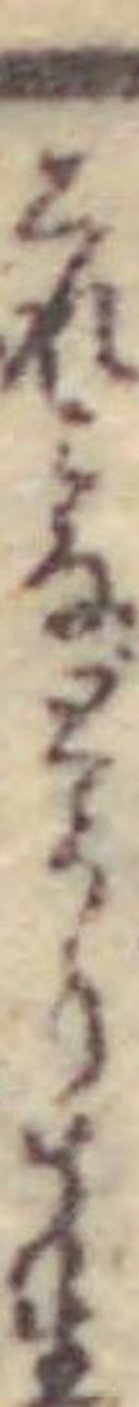これみなどうり先生の
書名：心学早染艸 : 3巻
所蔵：国立国会図書館 National Diet Library, JAPAN
